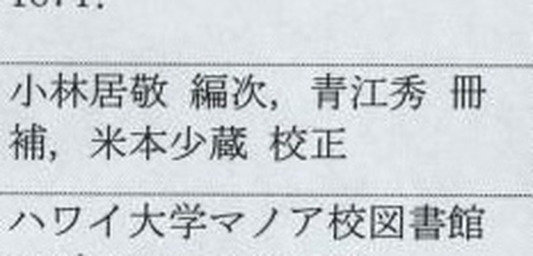米本少藏校正
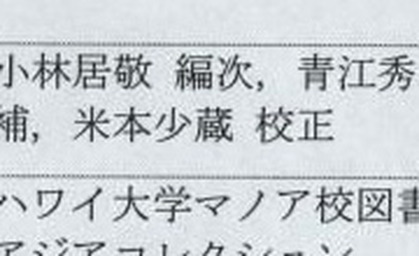米本少藏校正

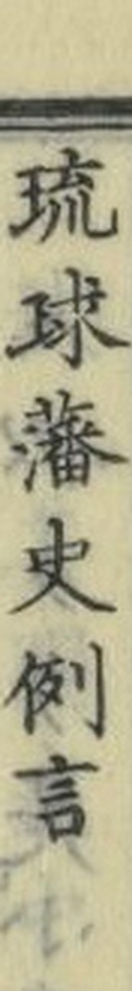琉球藩史例言
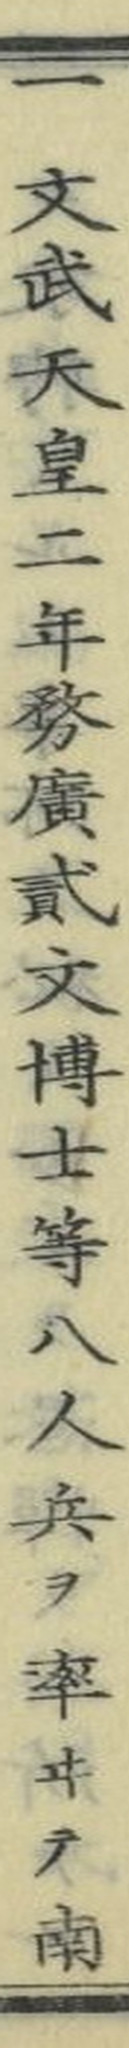一文武天皇二年務廣貳文博士等八人兵ヲ率ヰテ南
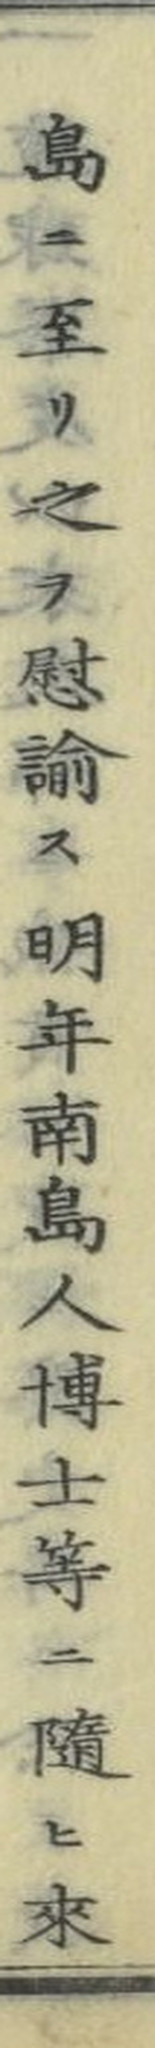島ニ至リ之ヲ慰諭ス明年南島人博士等ニ隨ヒ來
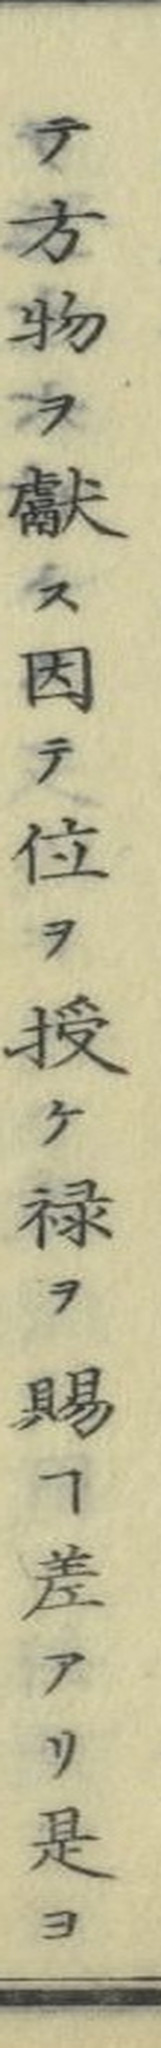テ方物ヲ獻ス因テ位ヲ授ケ禄ヲ賜コト差アリ是ヨ
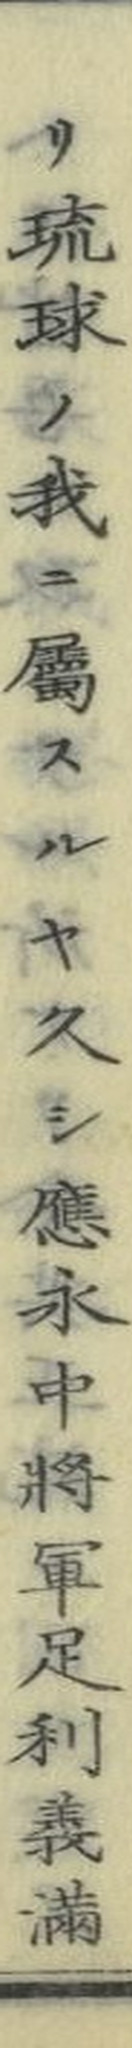リ琉球ノ我ニ屬スルヤ久シ應永中將軍足利義滿
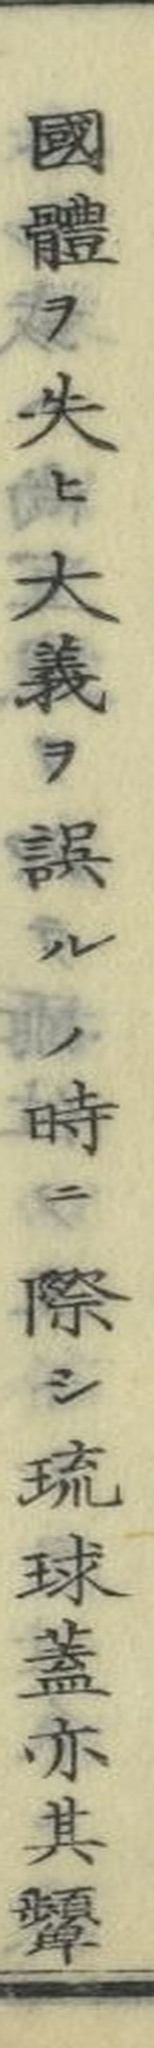國體ヲ失ヒ大義ヲ誤ルノ時ニ際シ琉球蓋亦其顰
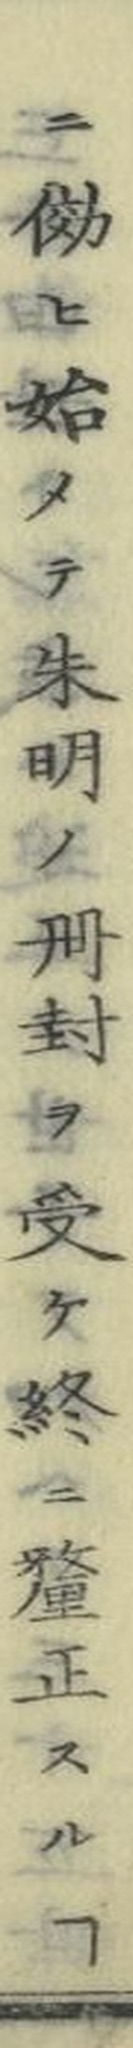ニ傚ヒ始メテ朱明ノ冊封ヲ受テ終ニ釐正スルコト
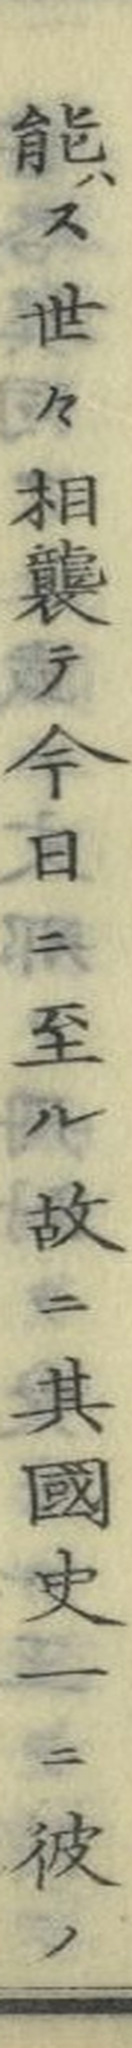能ハス世々相襲テ今日ニ至ル故ニ其國史一ニ彼ノ
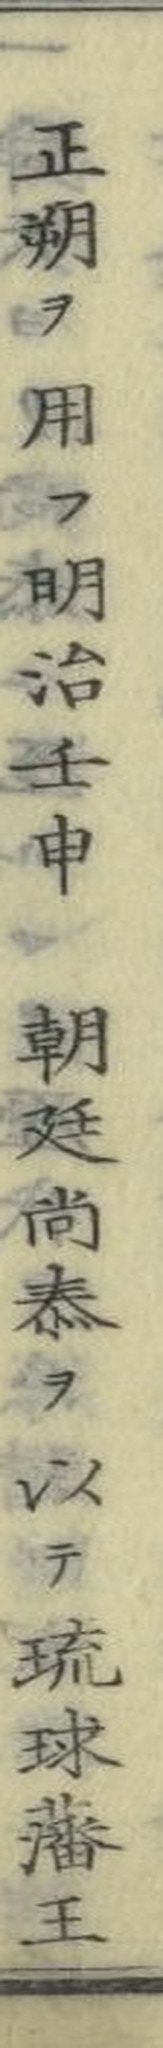正朔ヲ用フ明治壬申朝延尚泰ヲ以テ琉球藩王
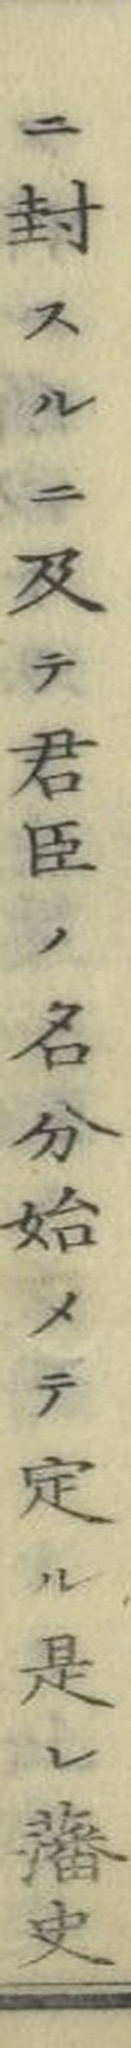ニ封スルニ及テ君臣ノ名分始メテ定ル是レ藩史

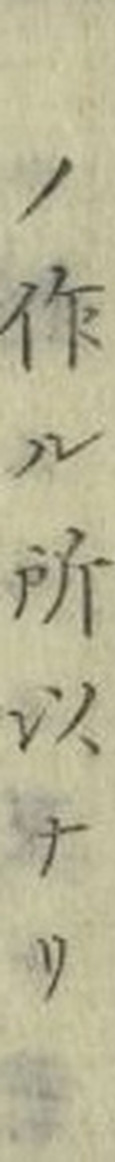ノ作ル所以ナリ
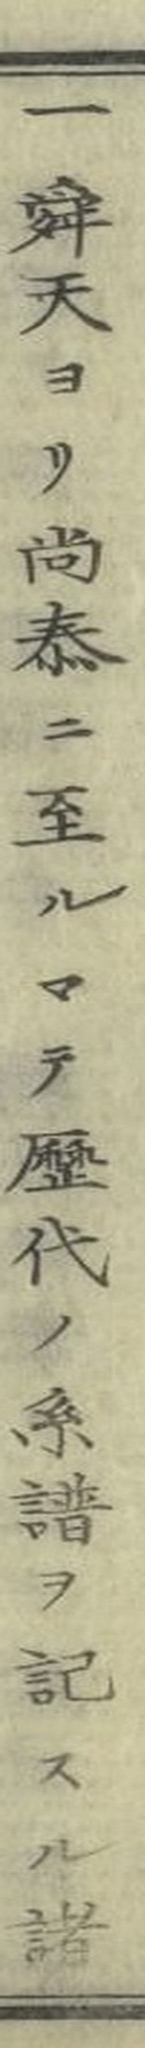一舜天ヨリ尚泰ニ至ルマテ歷代ノ系譜ヲ記スル諸
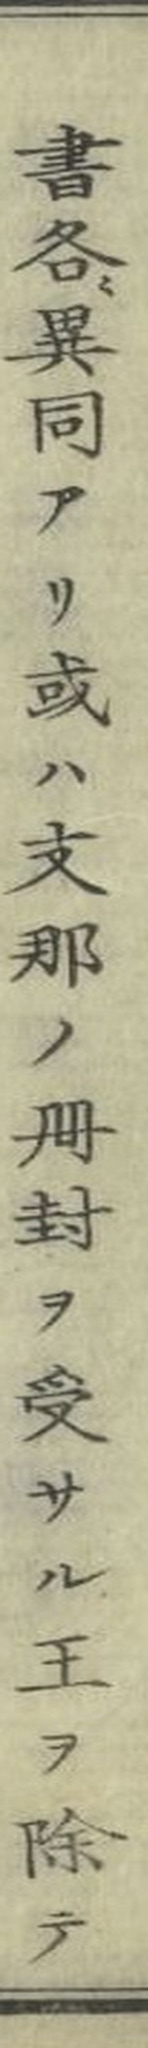書各々異同アリ或ハ支那ノ冊封ヲ愛サル王ヲ除テ
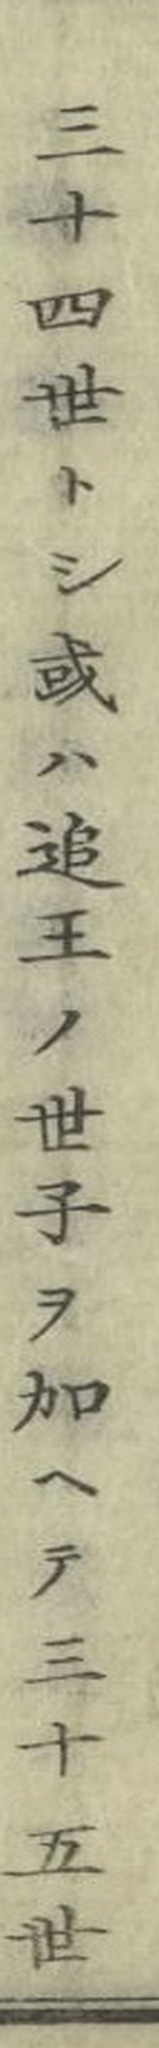三十四世トシ或ハ追王ノ世子ヲ加ヘテ三十五世
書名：琉球藩史 一之巻
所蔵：University of the Ryukyus Library
